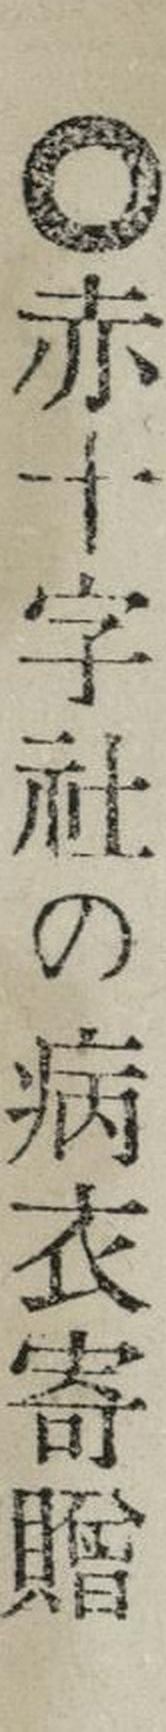○赤十字社の病衣寄贈
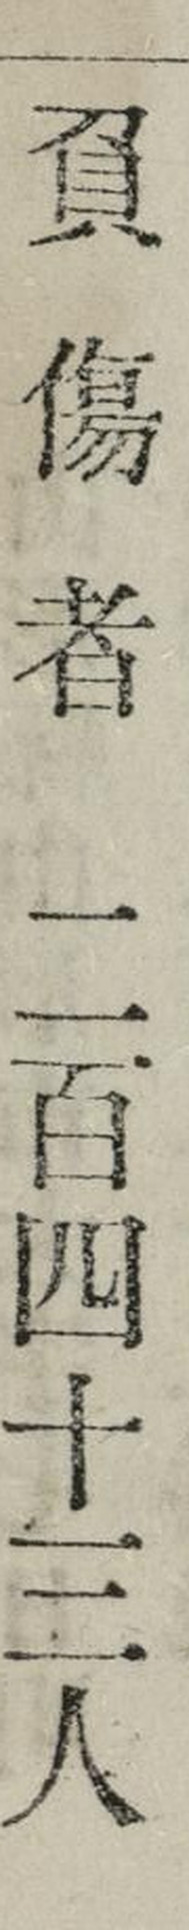負傷者二百四十三人
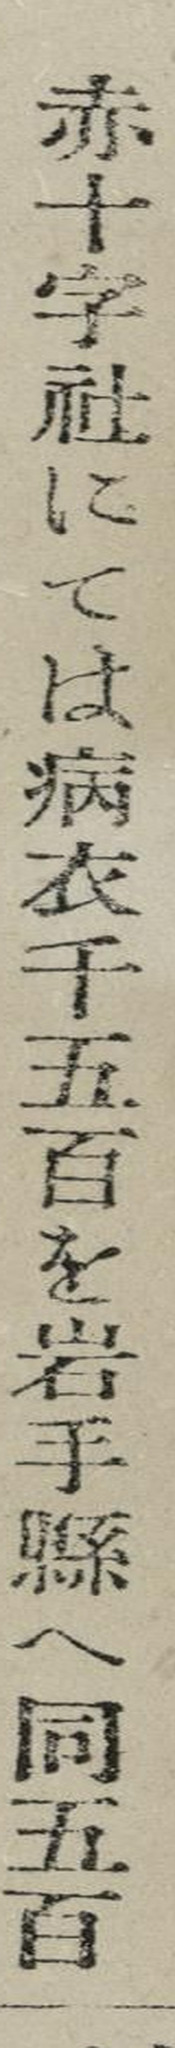赤十字社にては病衣千五百を岩手県へ同五百
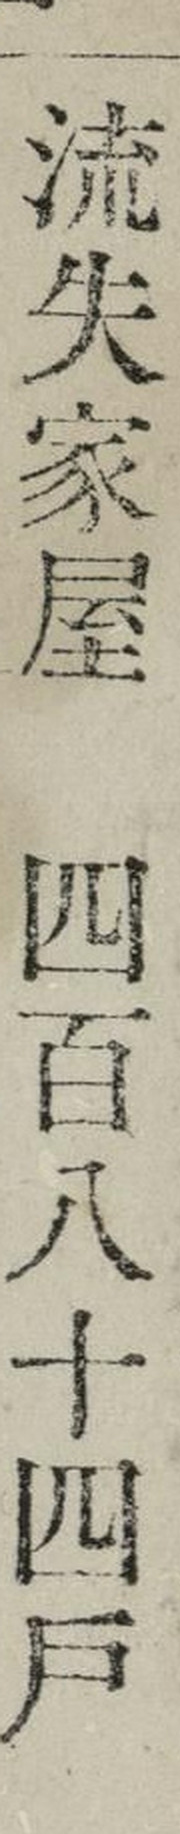流失家屋四百八十四戸
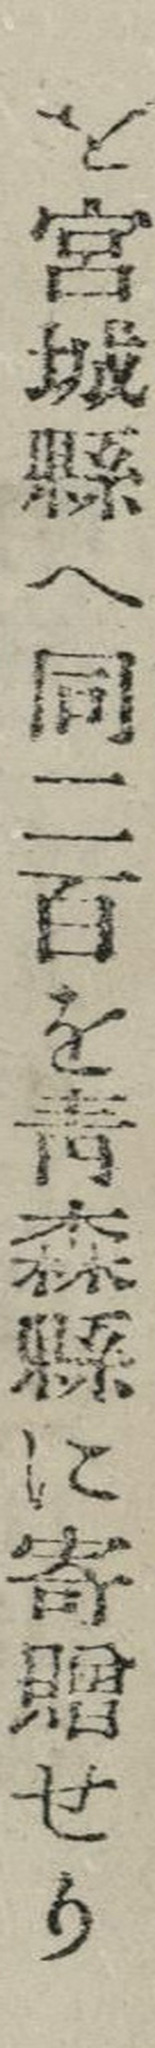を宮城県へ同二百を青森県に寄贈せり
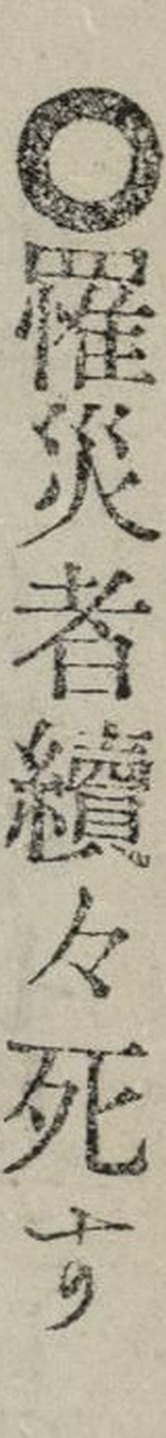○罹災者続々死す
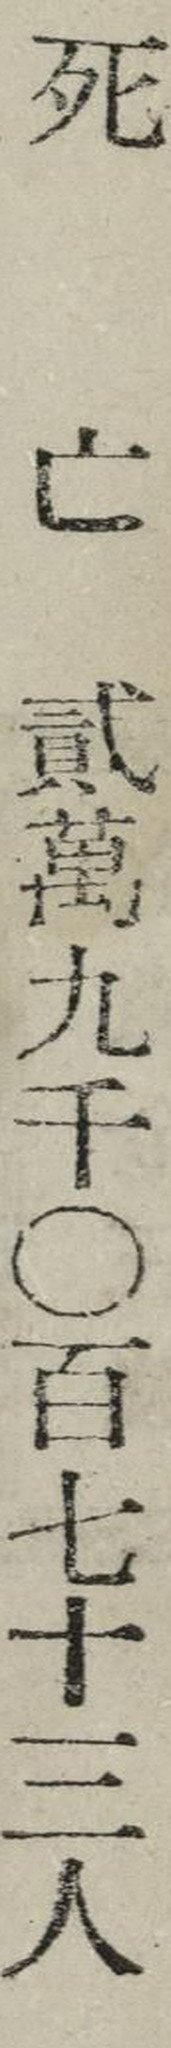死亡弐萬九千○百七十三人
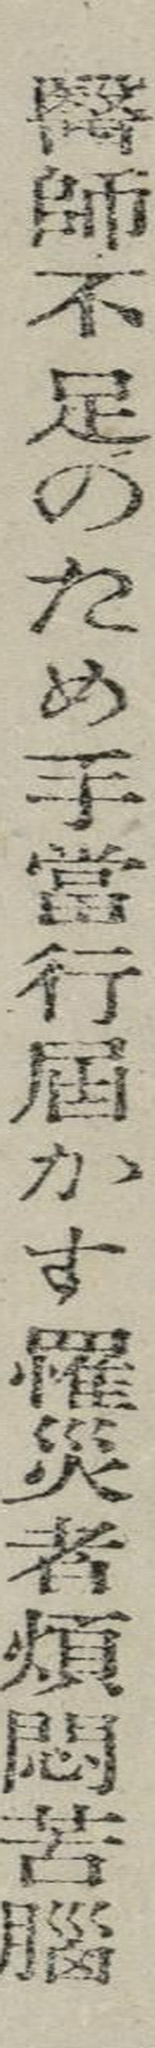医師不足のため手当行届かす罹災者煩悶苦悩
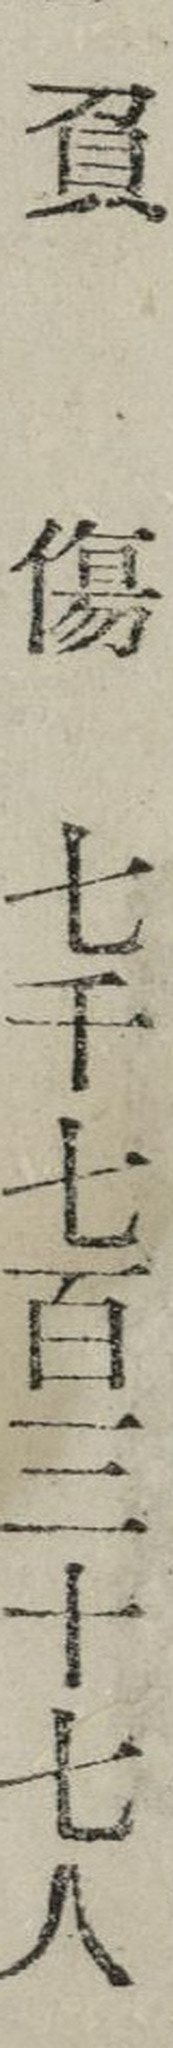負傷七千七百三十七人
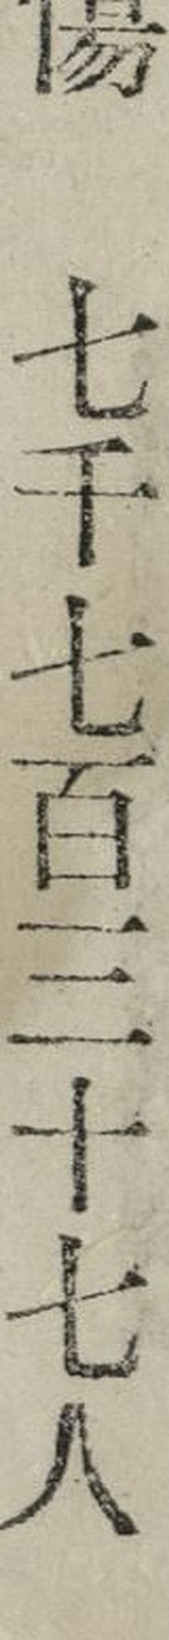負傷七千七百三十七人
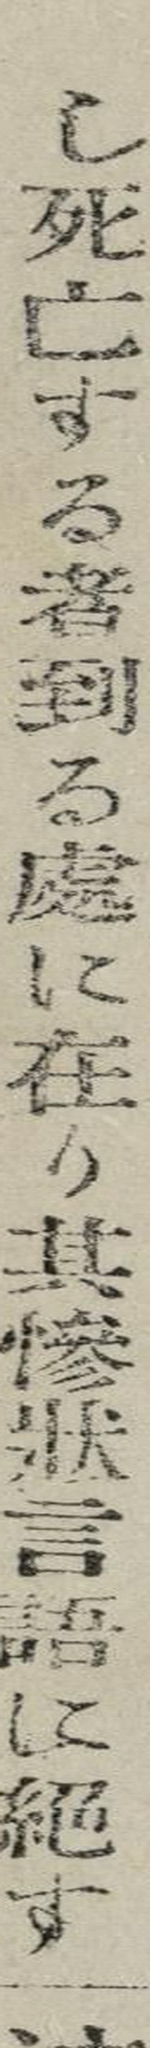し死亡する者到る処に在り其惨状言語に絶す
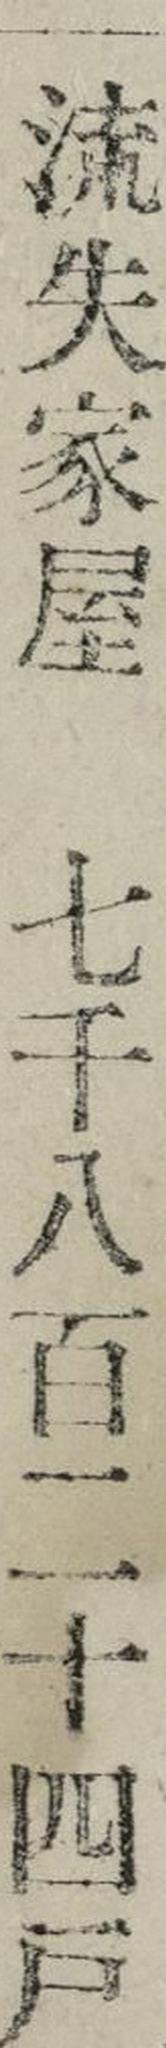流失家屋七千八百二十四戸

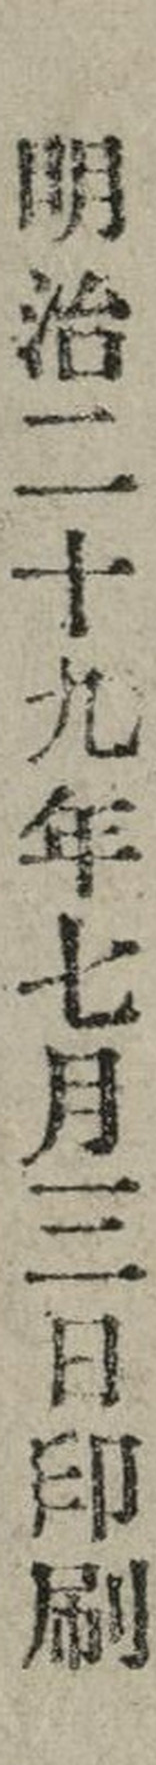明治二十九年七月三日印刷
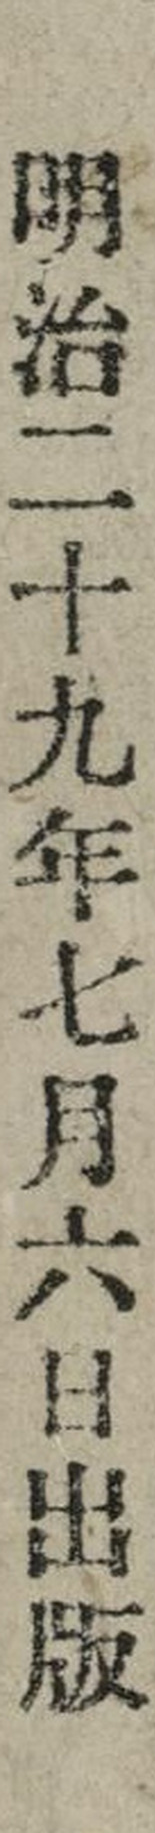明治二十九年七月六日出版
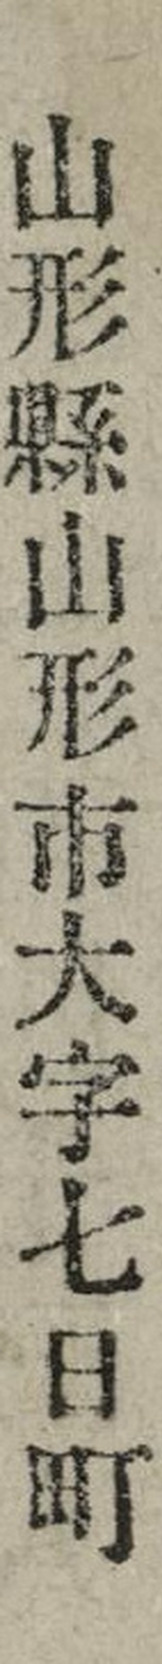山形県山形市大字七日町
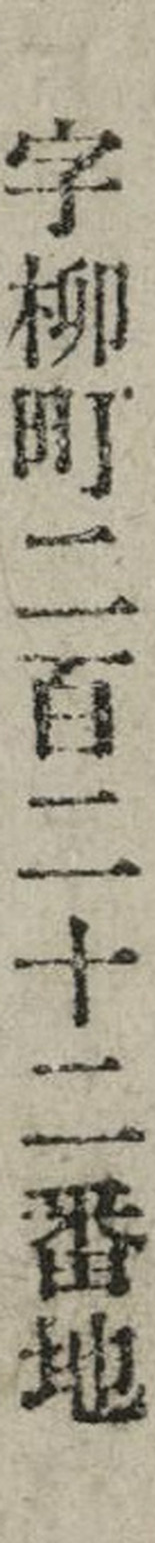字柳町二百二十二番地
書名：三陸海嘯細見
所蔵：東京大学地震研究所図書室 Earthquake Research Institute Library, The University of Tokyo, JAPAN
